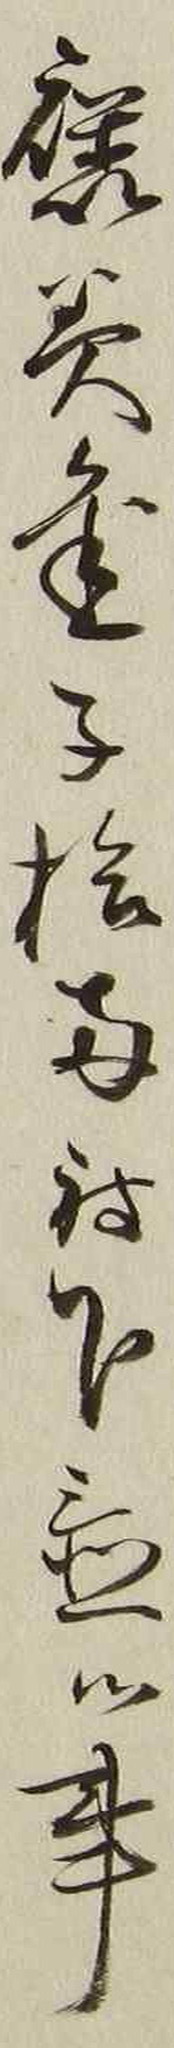褒美金子拾両被下置候事
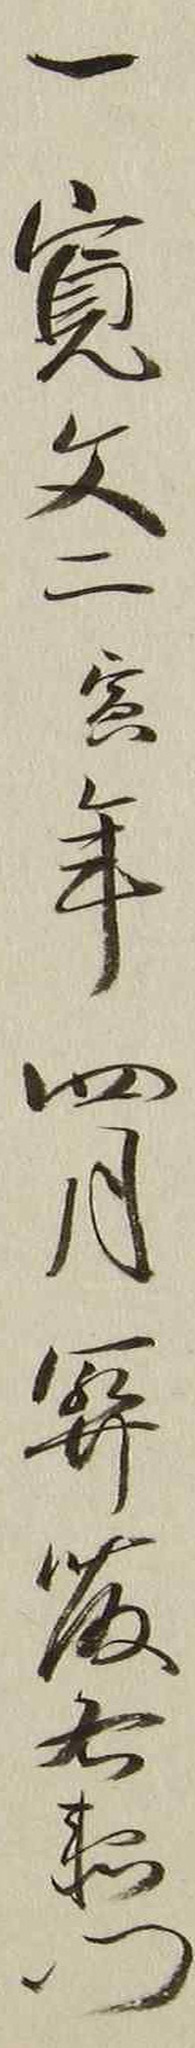一寛文二寅年四月関藤右衛門
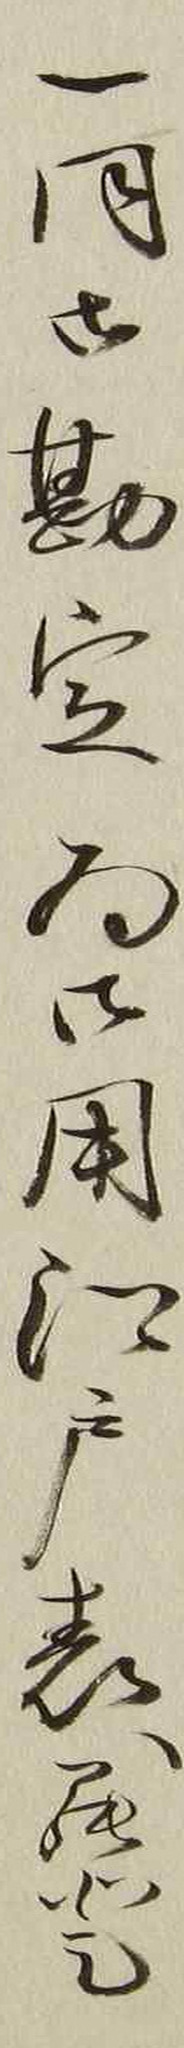一同御勘定為御用江戸表ㇸ罷登
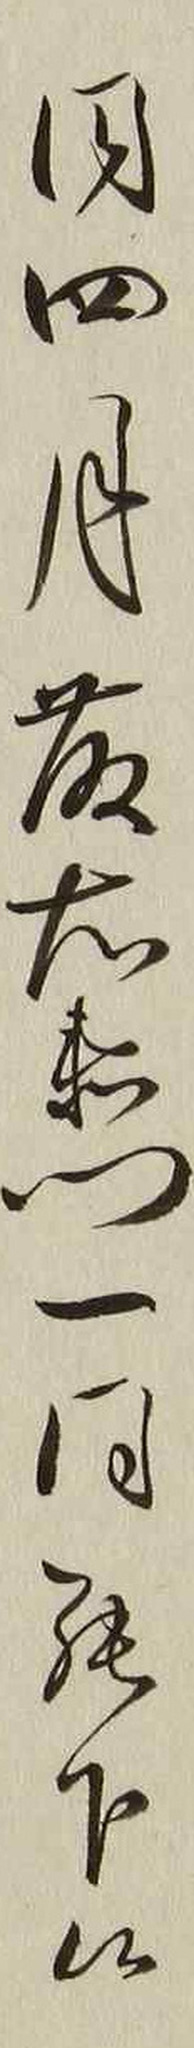同四月藤右衛門一同罷下候
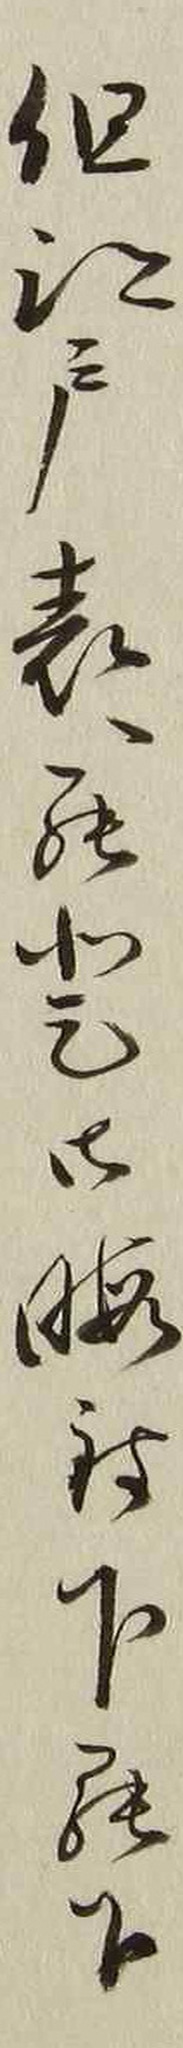但江戸表ㇸ罷登御暇被下罷下
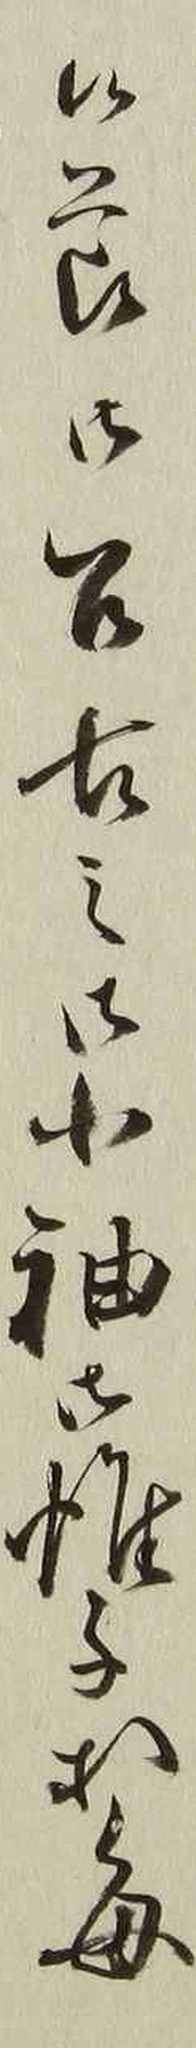候節御召古之御小袖御帷子等毎
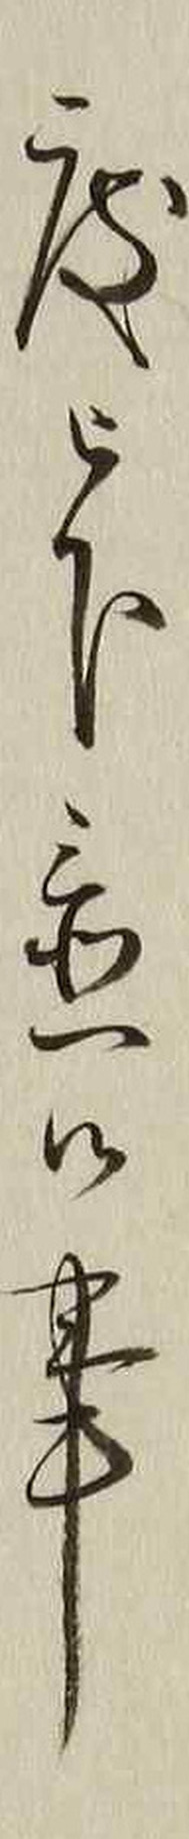度被下置候事
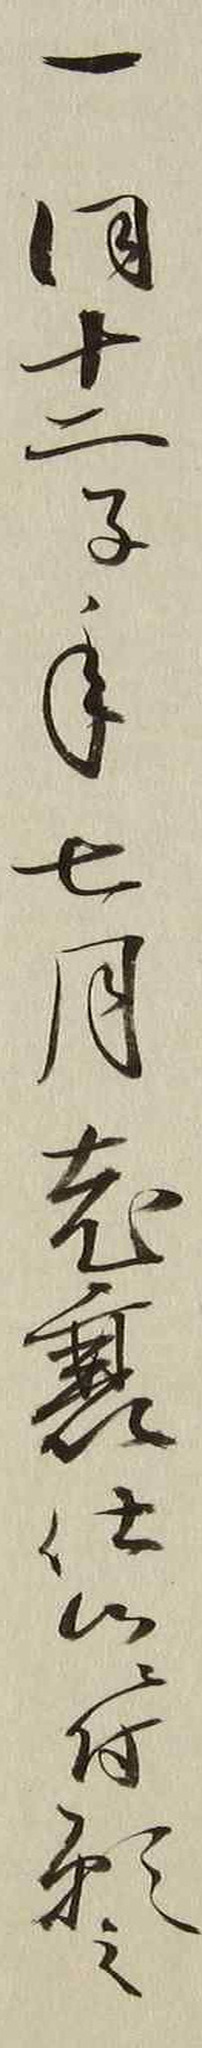一同十二子年七月老衰仕候ニ付願之
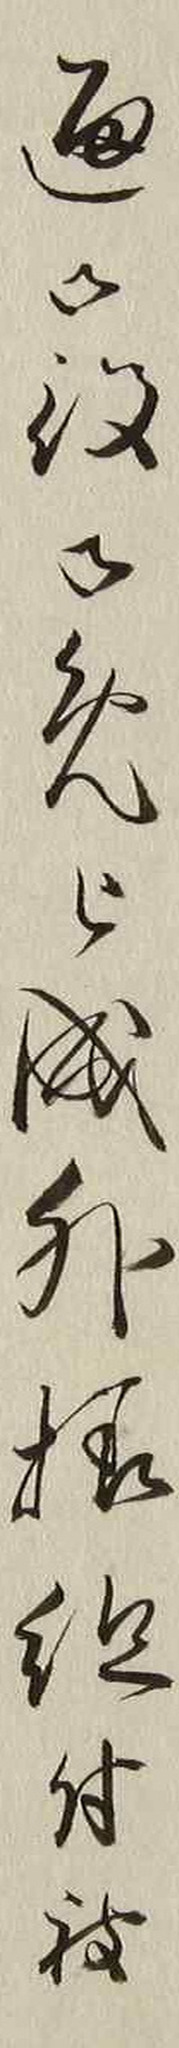通御役御免被成外様組付被
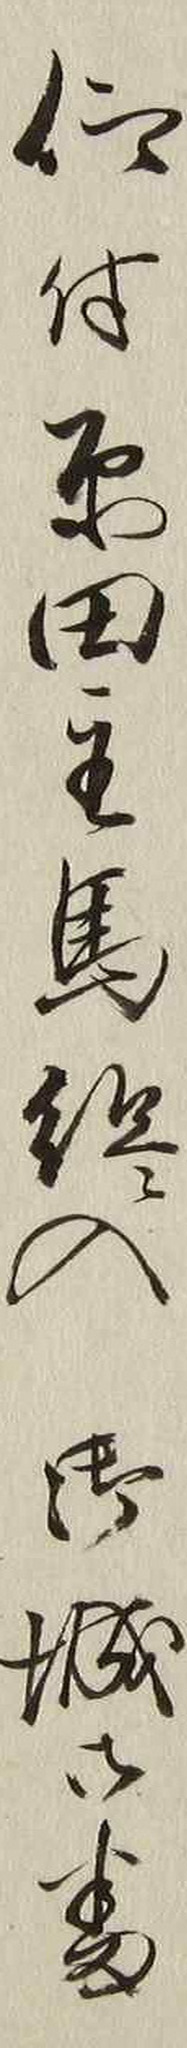仰付原田主馬組ニ入御城御番
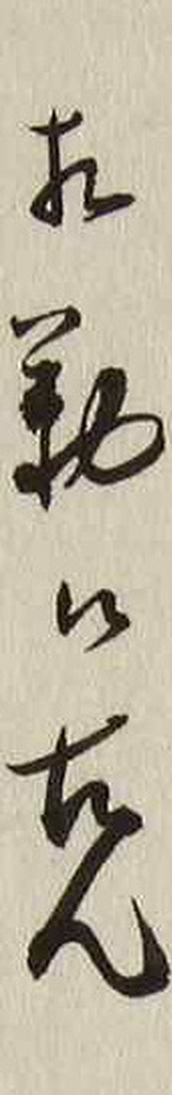相勤候事
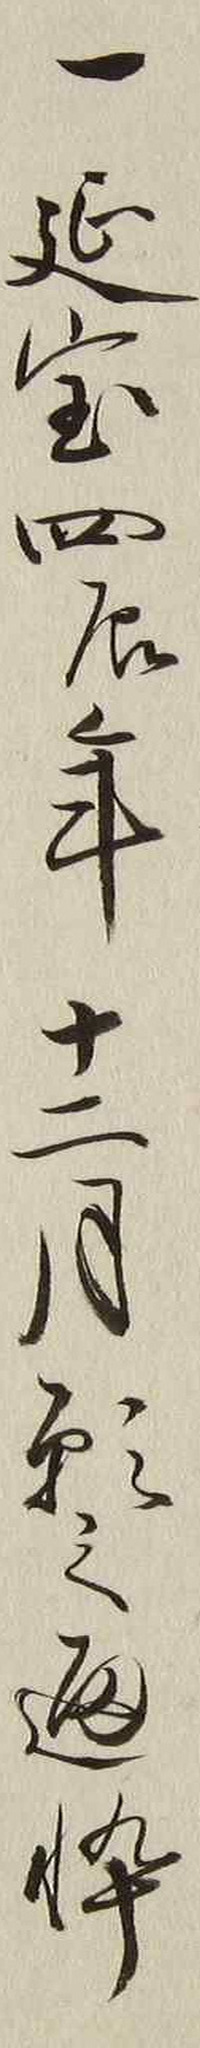一延宝四辰年十二月願之通忰
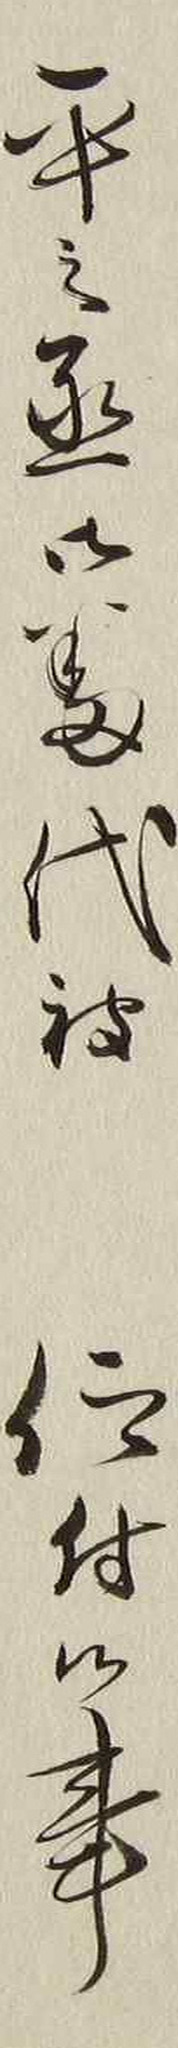平之丞御番代被仰付候事
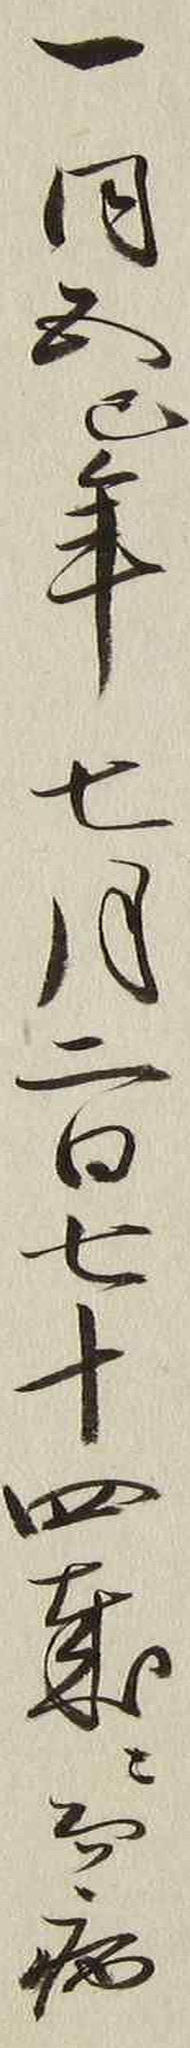一同五巳年七月二日七十四歳ニ而病
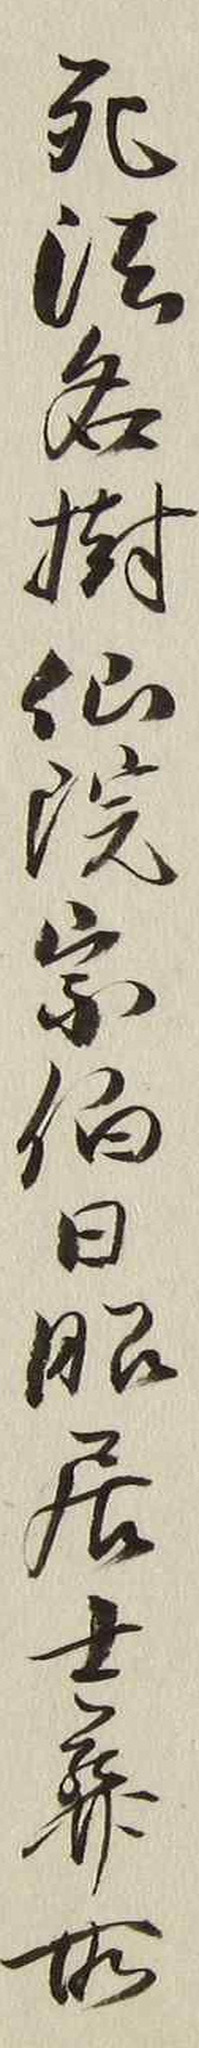死法名樹仙院宗伯日昭居士葬所
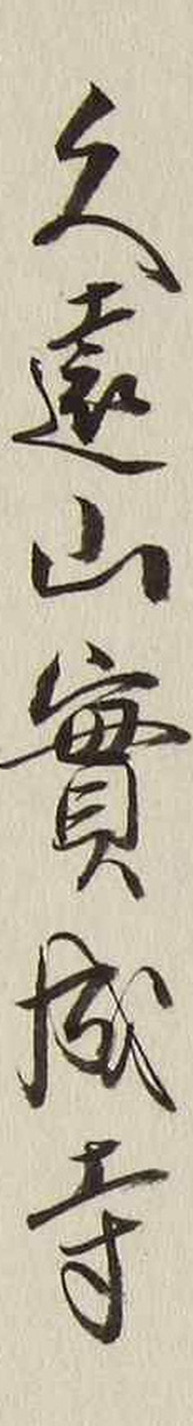久遠山実成寺
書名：諸士系譜　巻之163　な之部5
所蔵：会津若松市立会津図書館
